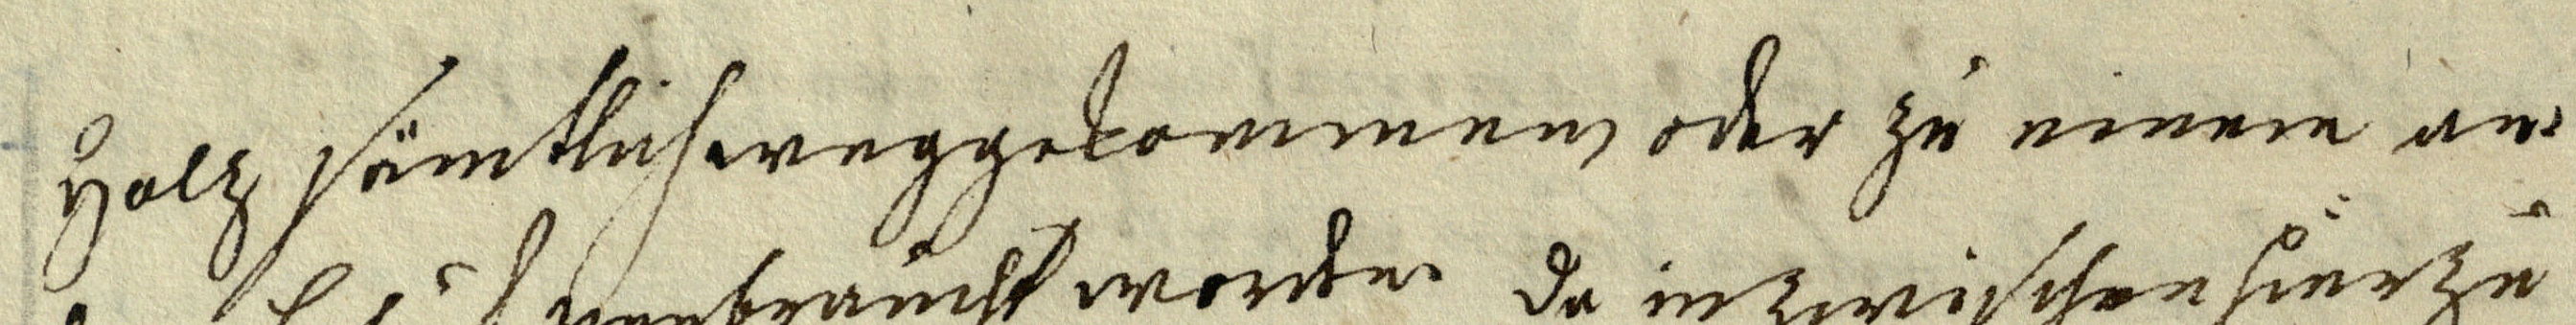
Holz sämtlich weggekommen oder zu einem an¬
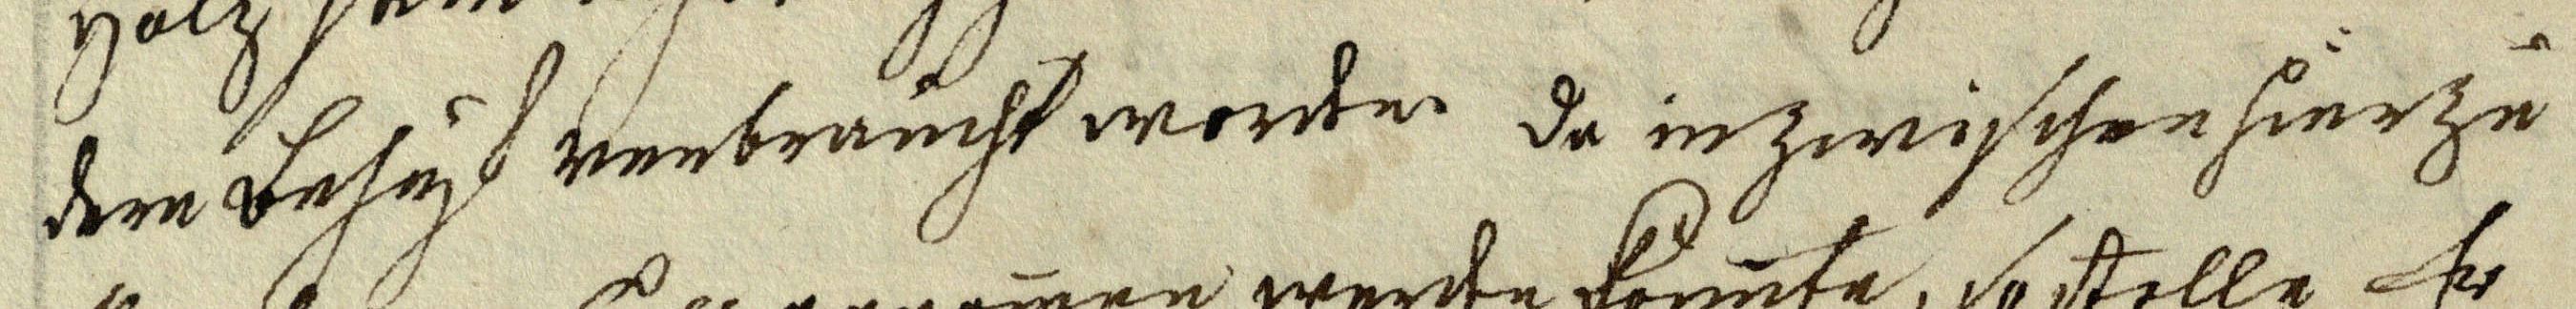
dern Behuf verbraucht worden. Da inzwischen hierzu
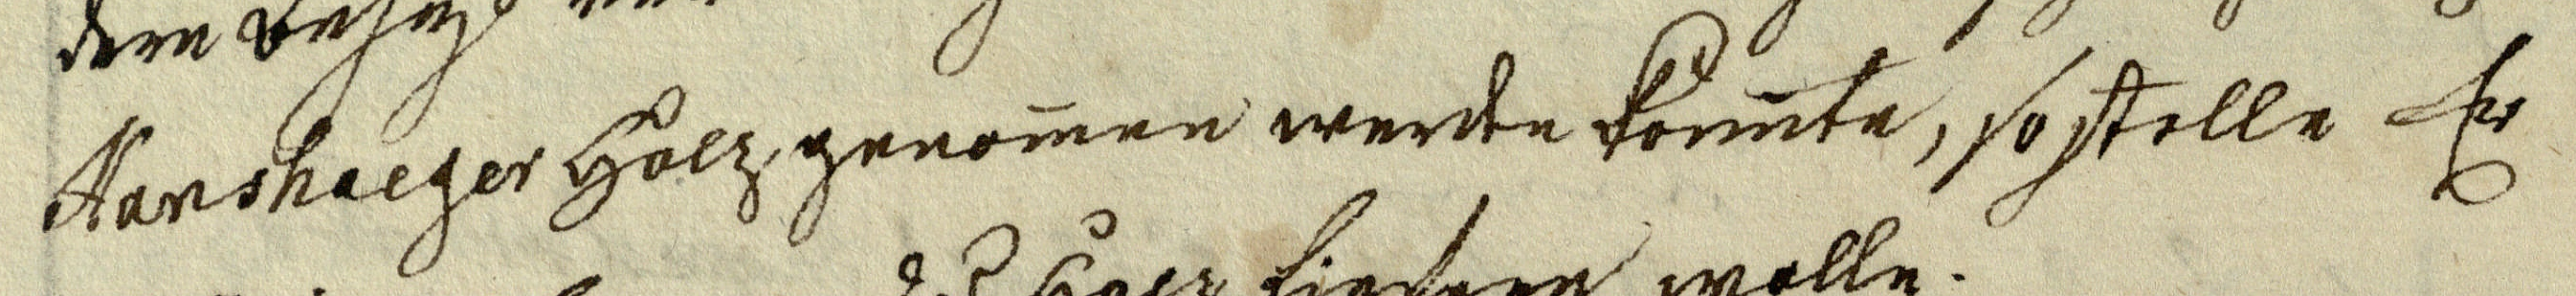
Hanshaeger Holz genommen werden könnte, so stellle Er
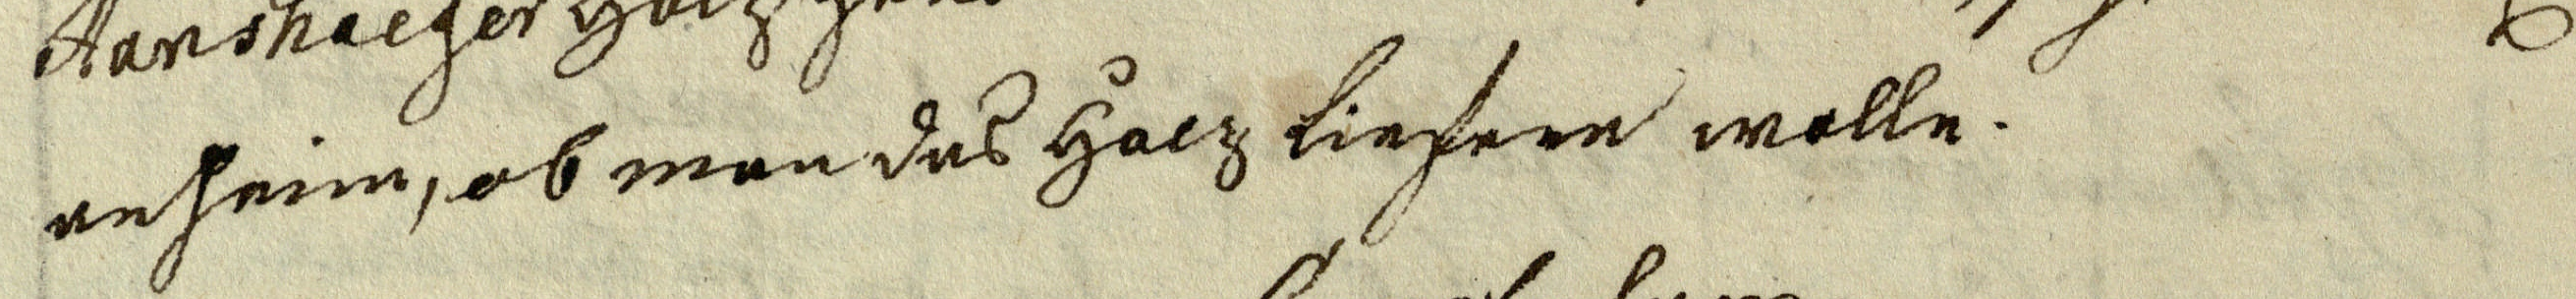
anheim, ob man das Holz liefern wolle.
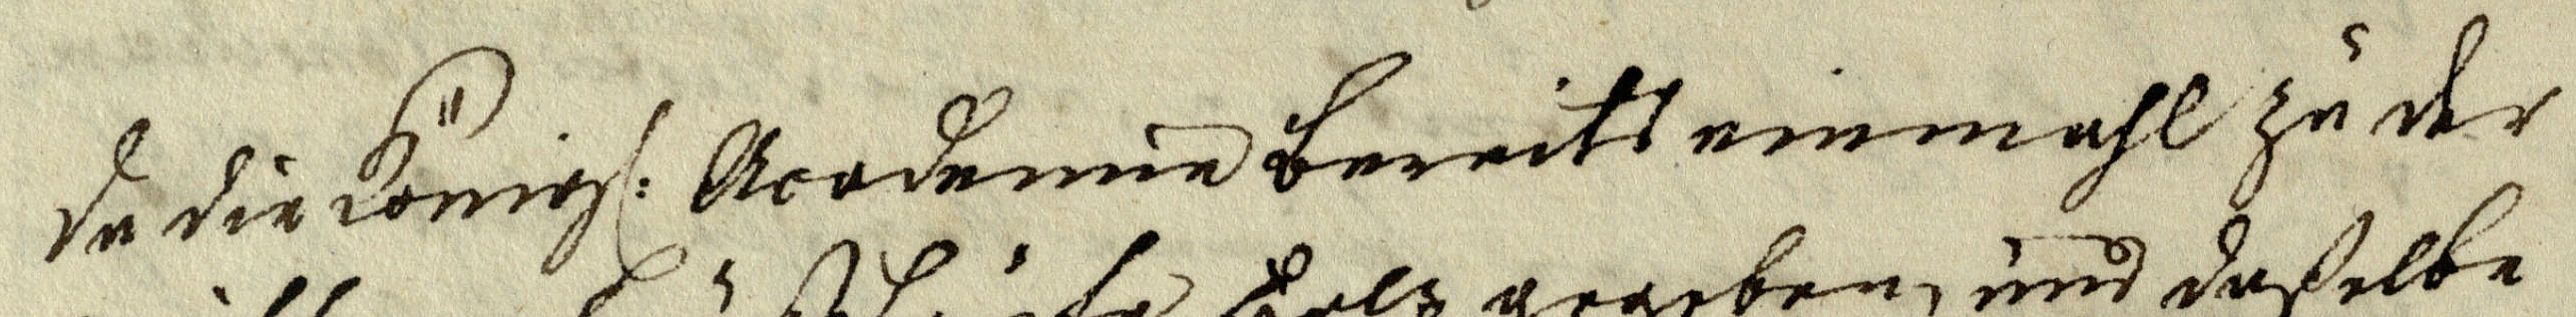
da die Königl. Academie bereits einmahl zu der
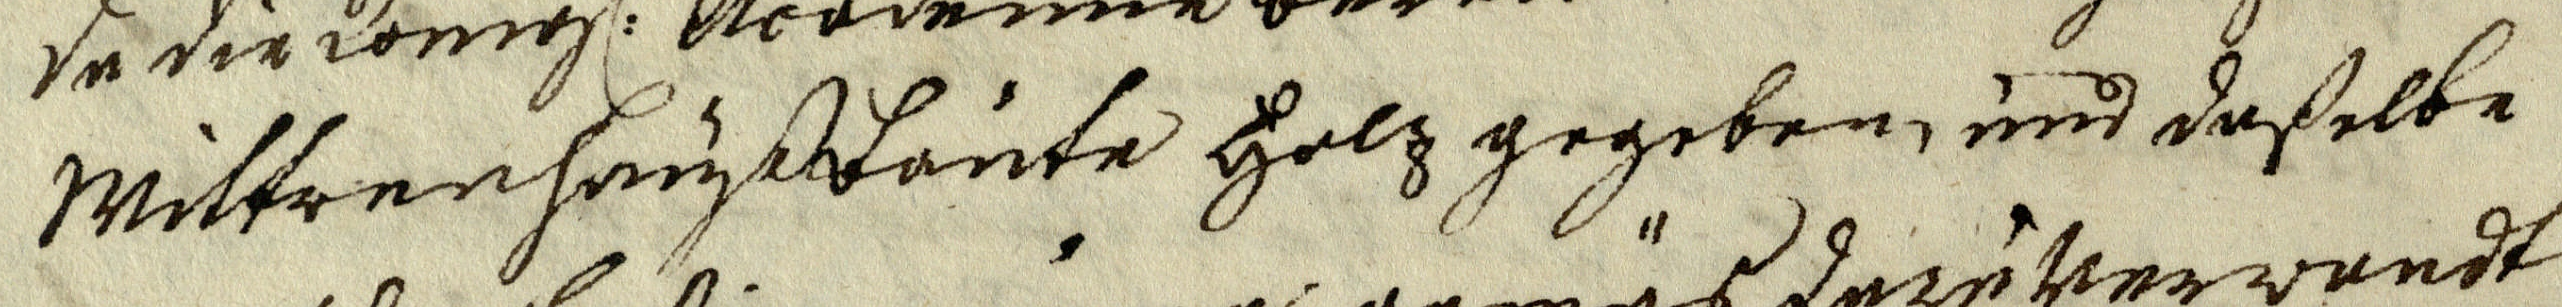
WittwenhausBaute Holz gegeben, und daßelbe
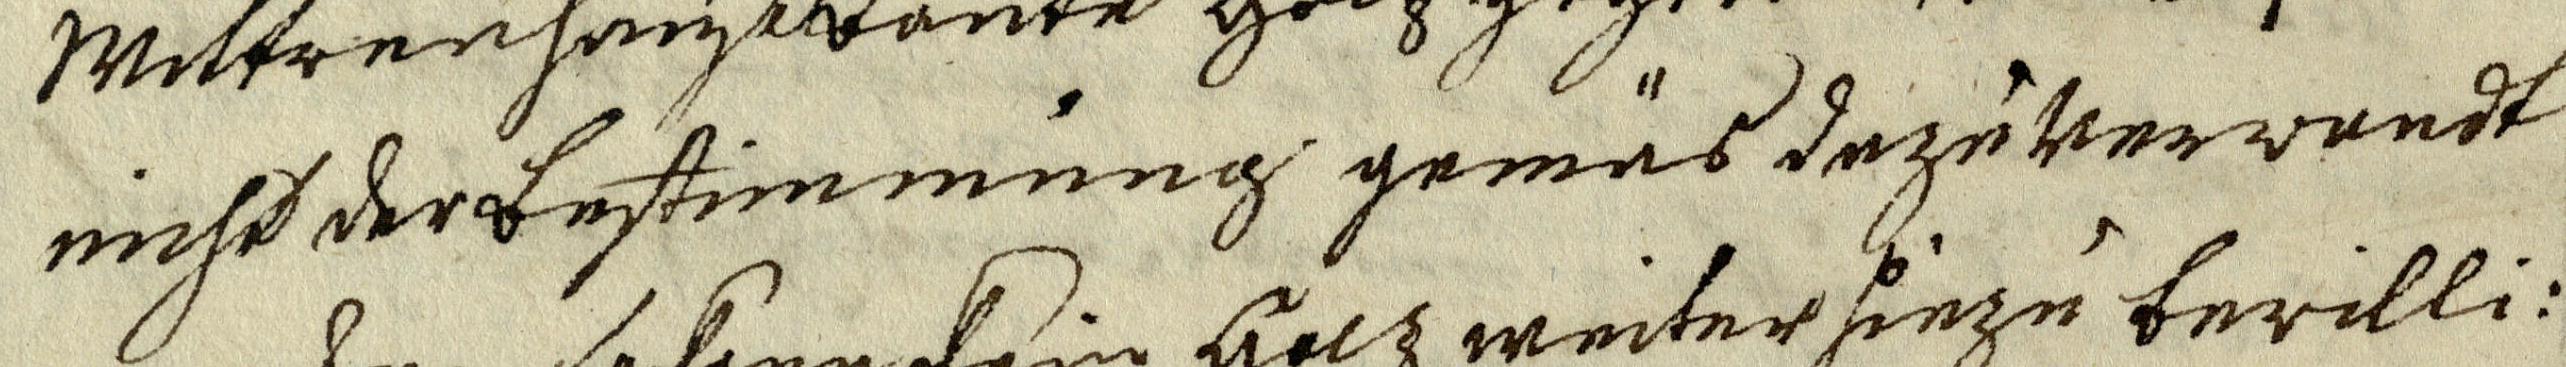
nicht der Bestimmung gemäs dazu verwandt
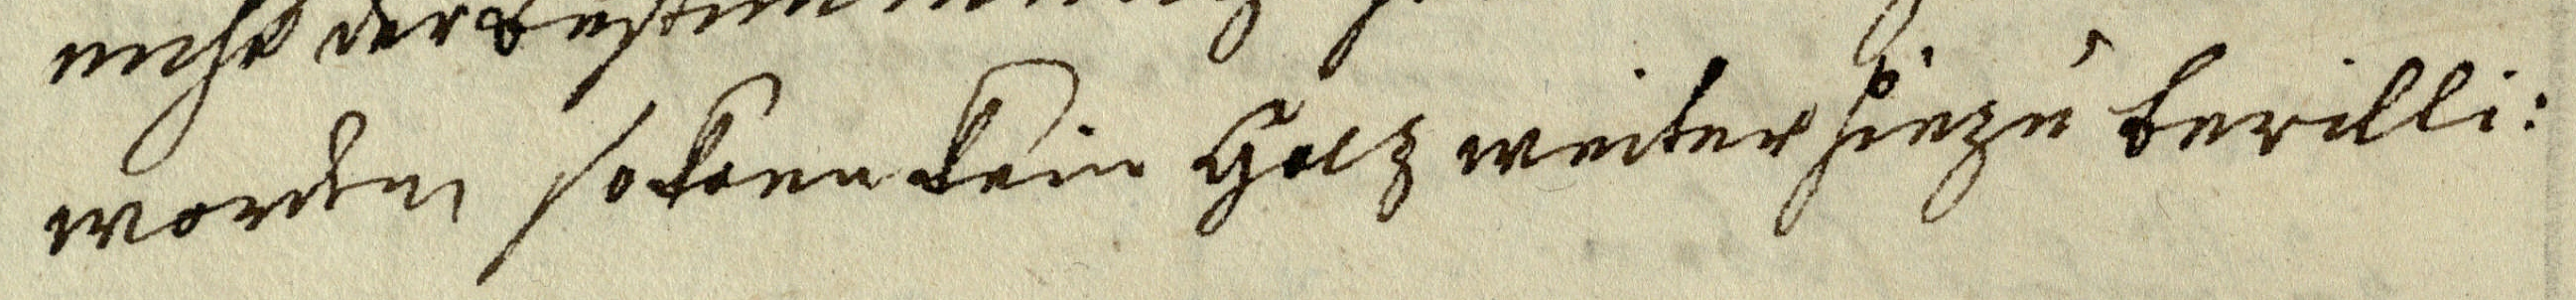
worden, so kann kein Holz weiter hiezu bewilli¬
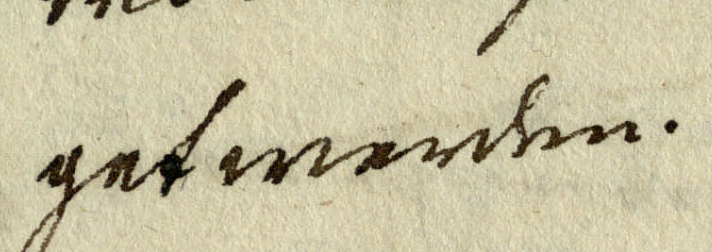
get werden.
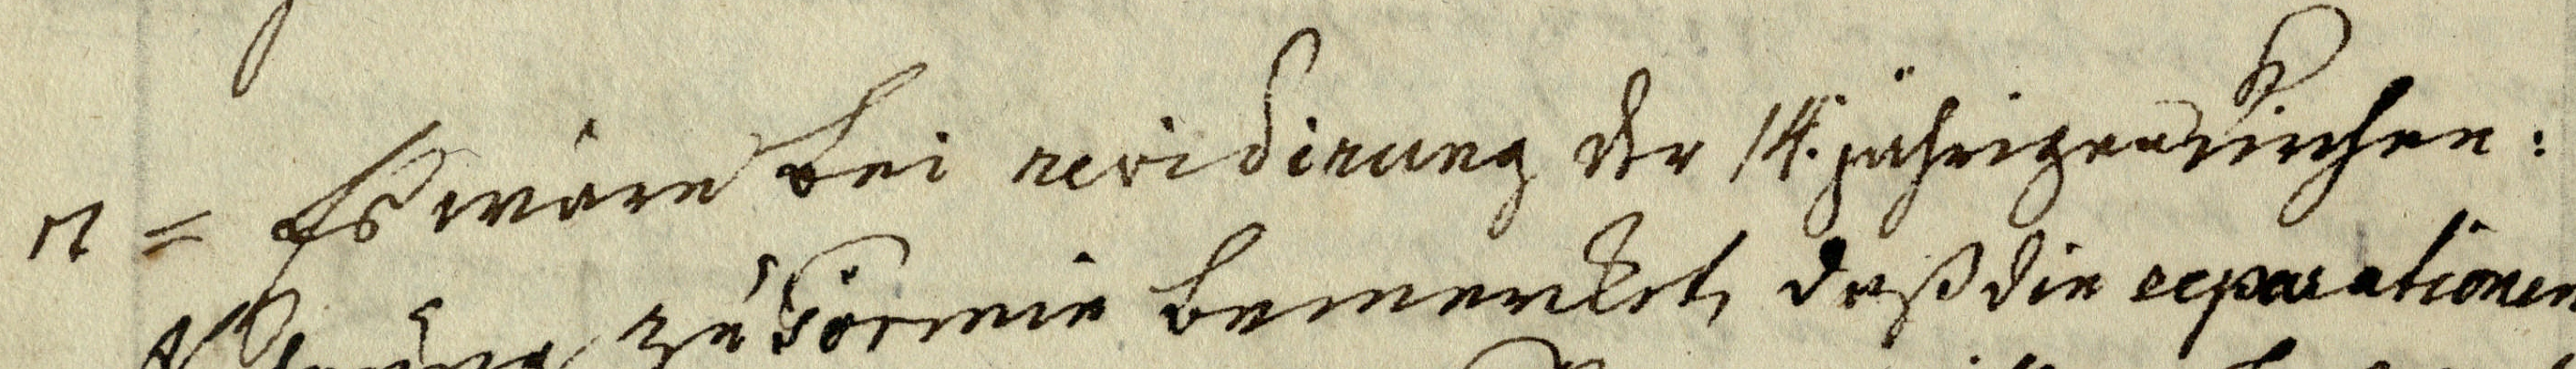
7. Es wäre bei revidirung der 14. jährigen Kirchen¬
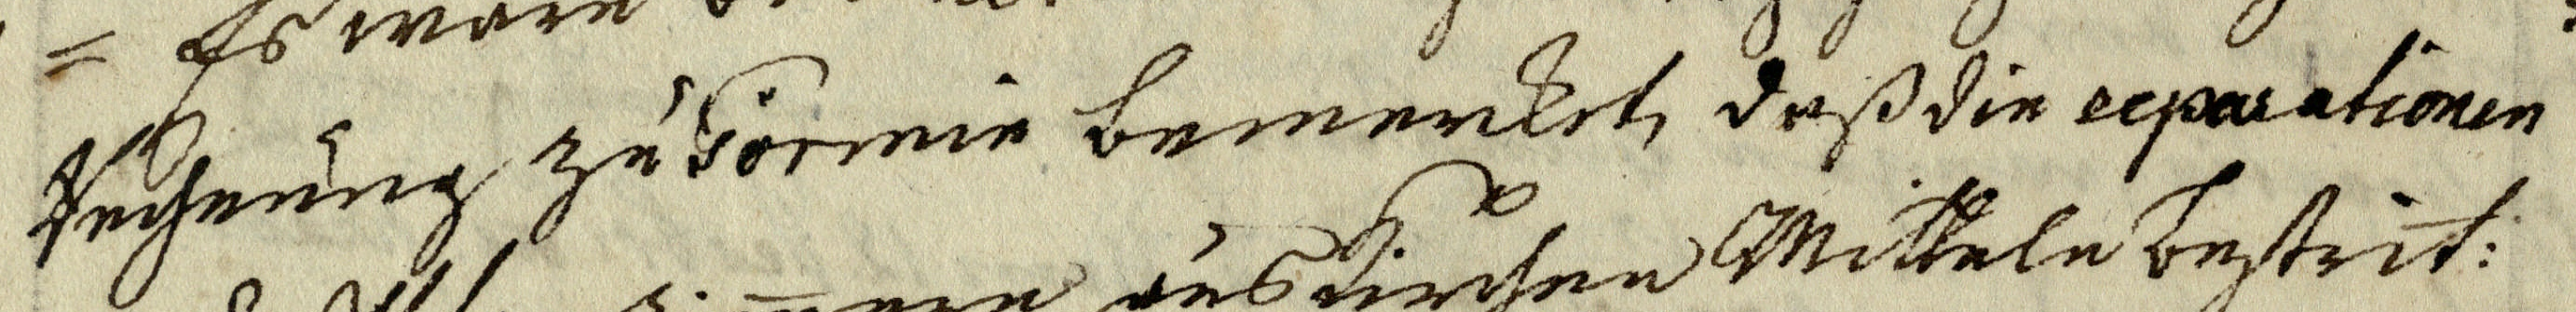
Rechnung zu Görmin bemercket, daß die reparationen
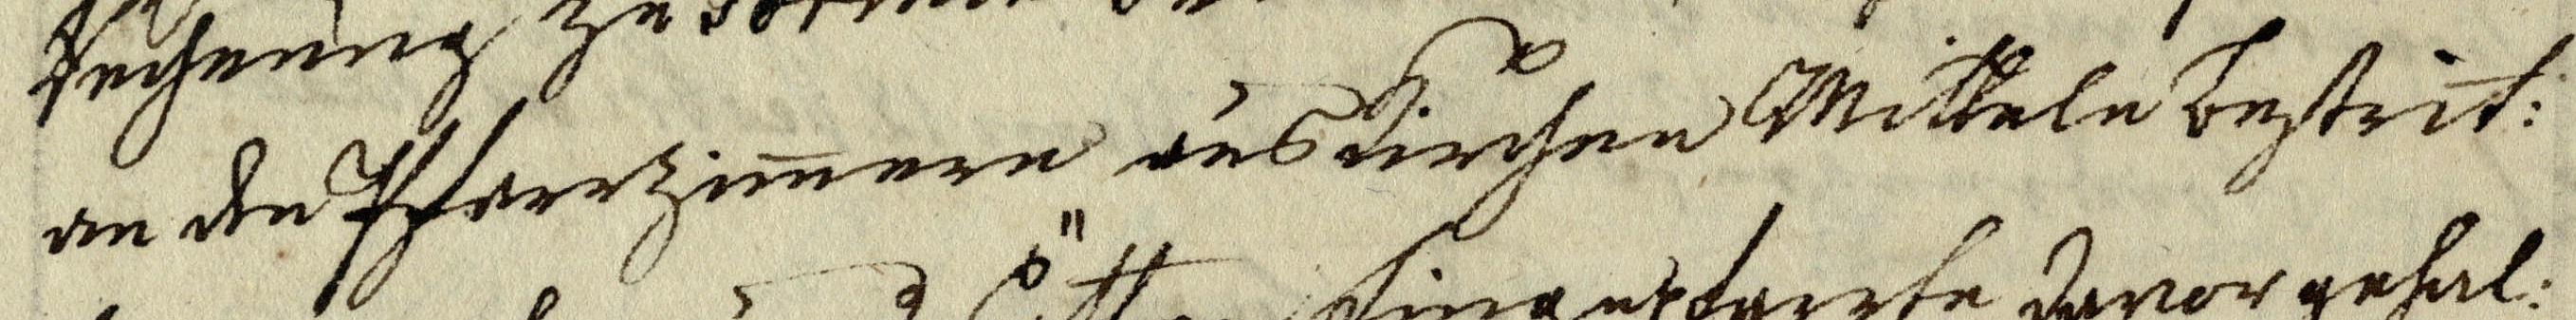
an den Pfarrzimmern aus KirchenMitteln bestrit¬
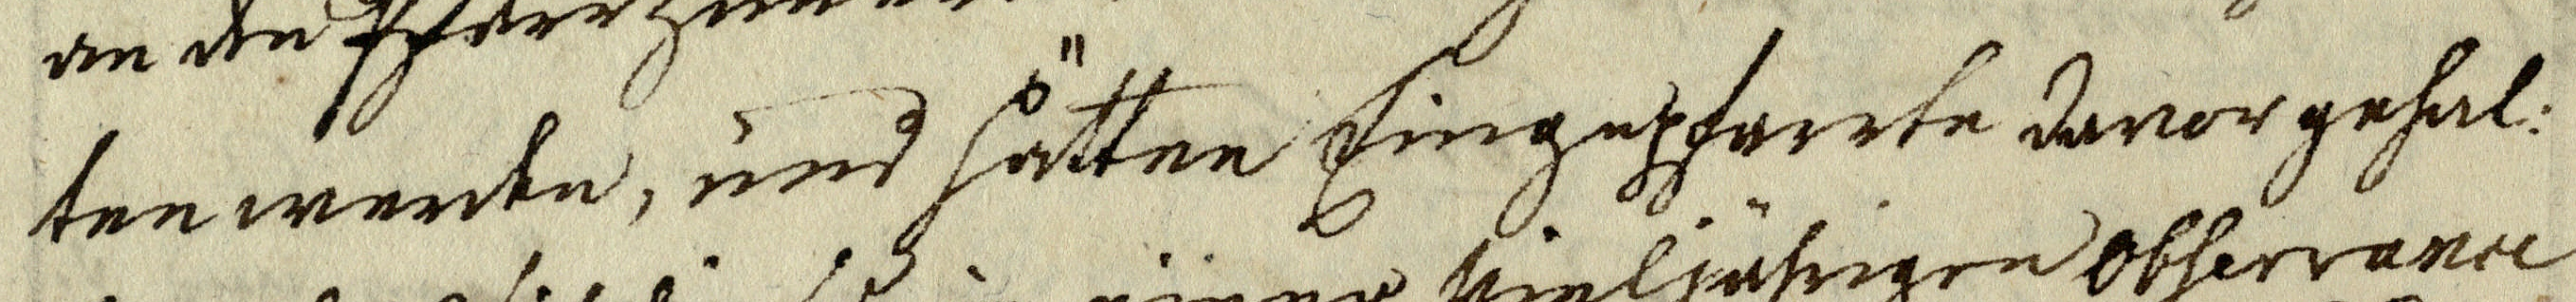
ten werden, und hätten Eingepfarrte davor gehal¬
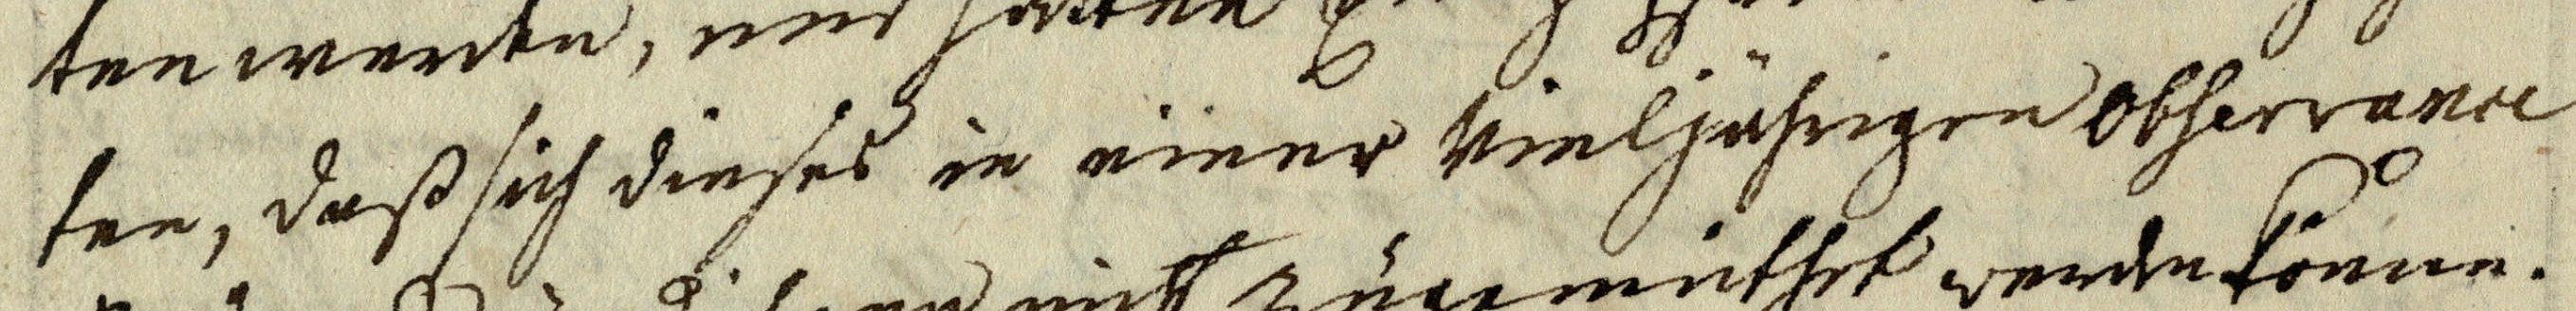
ten, daß sich dieses in einer vieljährigen Observance
